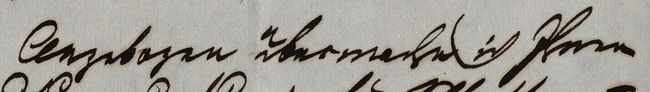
Angebogen übermache ich Ihnen
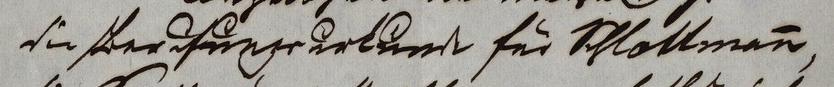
die Berufungsurkunde für Schlottmann,
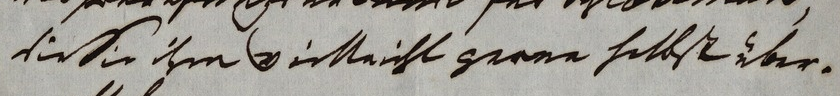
die Sie ihm vielleicht gerne selbst über-
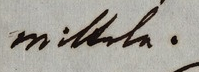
mitteln.
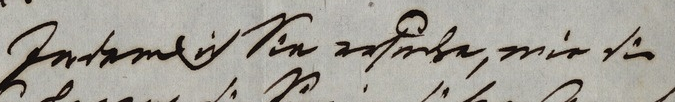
Indem ich Sie ersuche, mir die
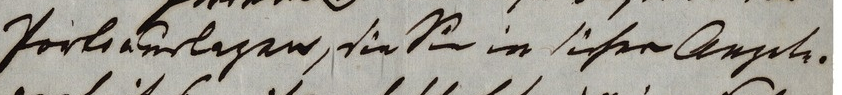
Portoauslagen, die Sie in dieser Angele-
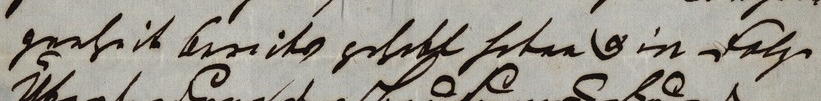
genheit bereits gehabt haben & in Folge
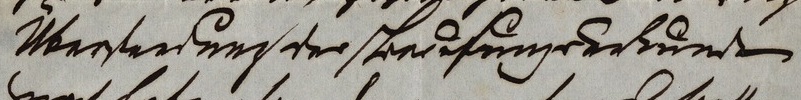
Übersendung der Berufungsurkunde
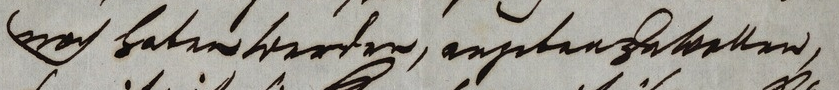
noch haben werden, angeben zu wollen,
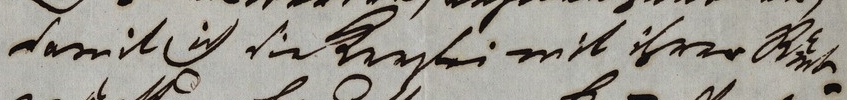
damit ich die Kanzlei mit ihrer Rück-
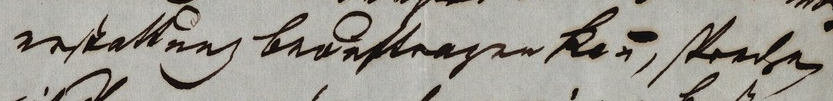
erstattung beauftragen kann, spreche
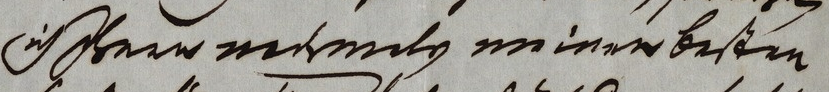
ich Ihnen nochmals meinen besten
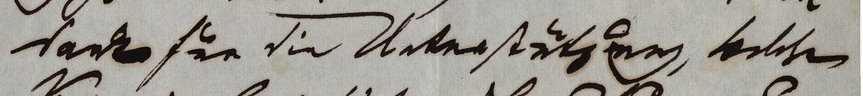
Dank für die Unterstützung, welche
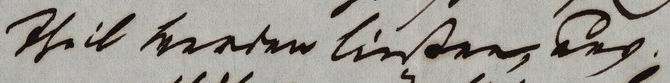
Theil werden ließen, aus.
